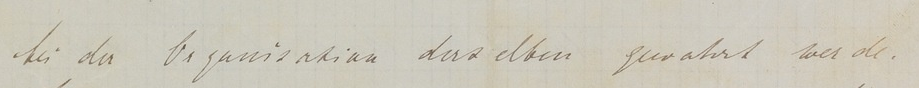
bei der Organisation derselben gewahrt werde.
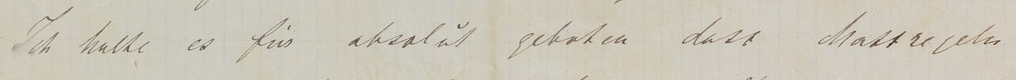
Ich halte es für absolut geboten dass Massregeln
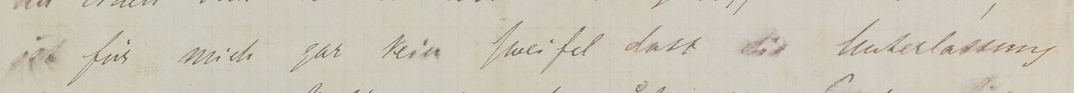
ist für mich gar kein Zweifel dass die Unterlassung
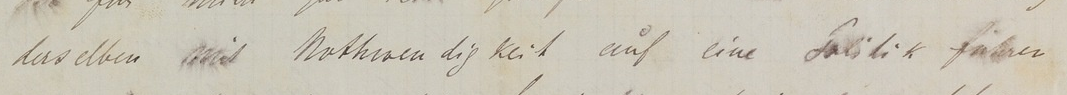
derselben mit Nothwendigkeit auf eine Politik führen
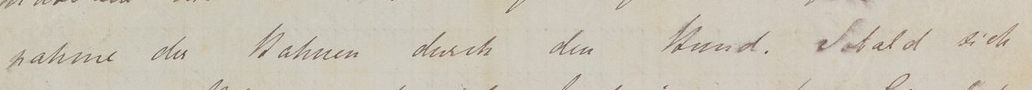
nahme der Bahnen durch den Bund. Sobald sich
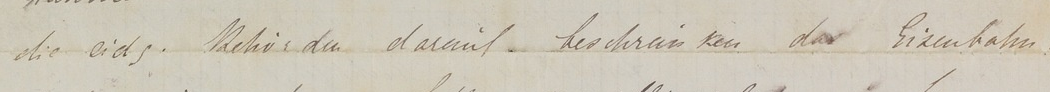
die eidg. Behörden darauf beschränken das Eisenbahn-
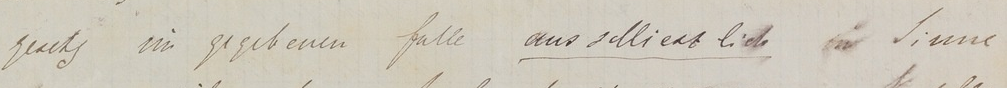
gesetz im gegebenen Falle ausschliesslich im Sinne
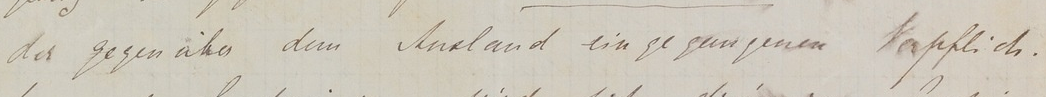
der gegenüber dem Ausland eingegangenen Verpflich-
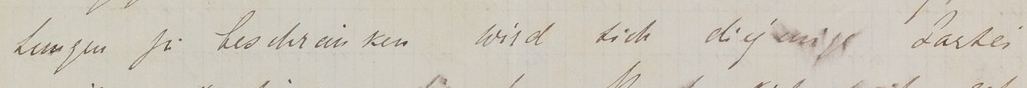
tungen zu beschränken wird sich diejenige Partei
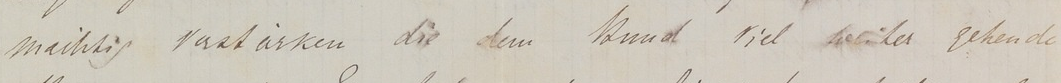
mächtig verstärken die dem Bund viel weiter gehende
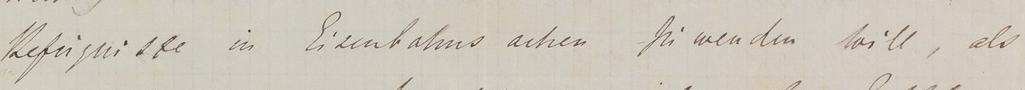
Befugnisse in Eisenbahnsachen zuwenden will, als
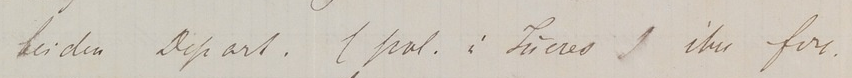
beiden Départ. (pol. u Inneres) ihre for-
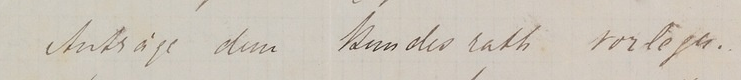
Anträge dem Bundesrath vorlegen.
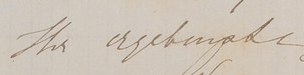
Ihr ergebenster
